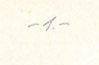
-1.-
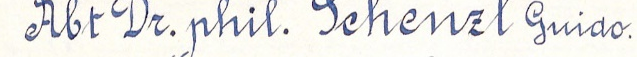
Abt Dr. phil. Schenzel Guido.
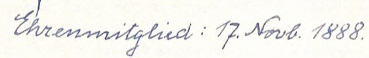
Ehrenmitglied: 17. Novb. 1888.
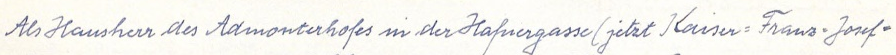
Als Hausherr des Admonterhofes in der Hafnergasser (jetzt Kaiser-Franz-Josef-
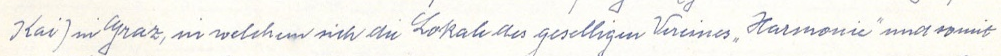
Kai) in Graz, in welchem sich die Lokalles geselligen Vereins "Harmonie" und womit
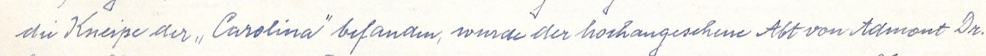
die Kneipe der "Carolina" befanden, wurde der hochangesehene Abt von Admont Dr.
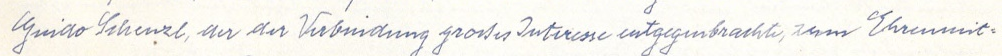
Guido Schenzel, der der Verbindung großes Interesse entgegenbrachte, zum Ehrenmit-
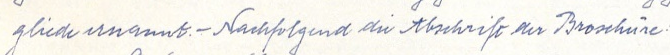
gliede ernannt. - Nachfolgend die Abschrift der Broschüre:
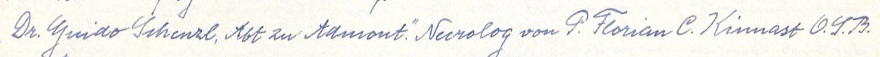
"Dr. Guido Schenzel, Abt von Admont." Necrolog von P. Florian C. Kinnest O.S.B.
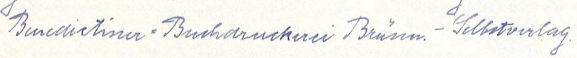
Benedictiner-Buchdruckerei Brünn - Selbstverlag.
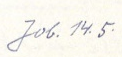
Job. 14.5.
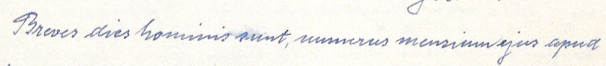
Breves dies hominis sunt, numerus mensium ejus apud
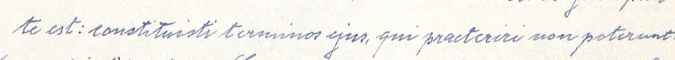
te est: constituisti terminos ejus qui praeteriri non poterunt.
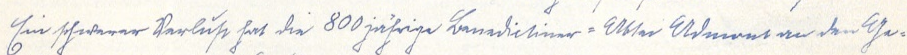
Ein schwerer Verlus hat die 800jährige Benedictiner-Abtei Admont an dem Ge-
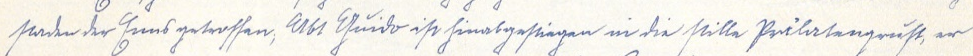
stade der Enns getroffen; Abt Guido ist hinabgestiegen in die stille Prälatengruft, er
